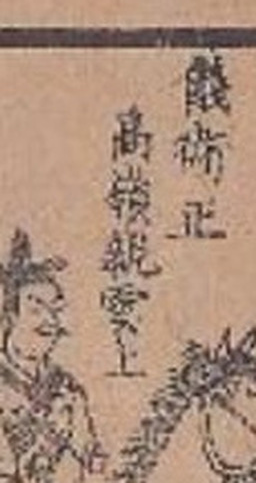高嶺親雲上
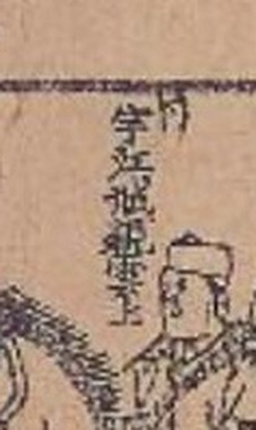宇江城親雲上
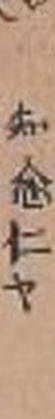知念仁ヤ
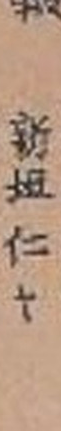新垣仁ヤ
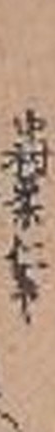中村渠仁ヤ
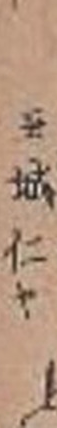玉城仁ヤ
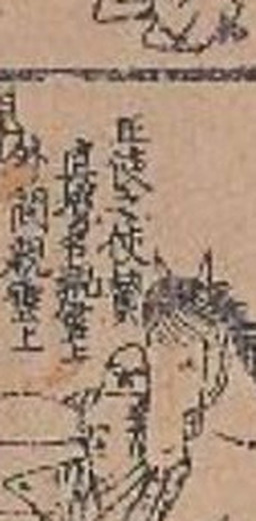正使之使賛
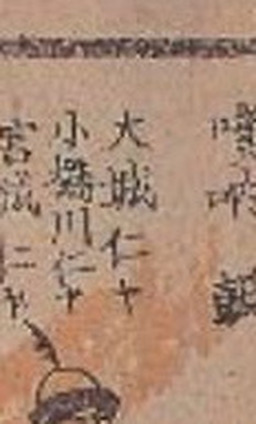大城仁ヤ
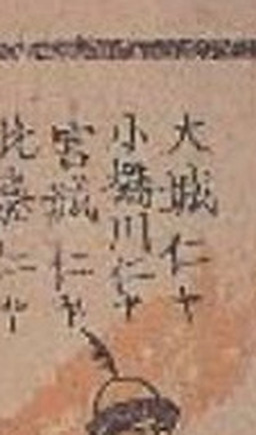小橋川仁ヤ
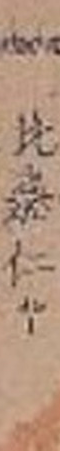比嘉仁ヤ
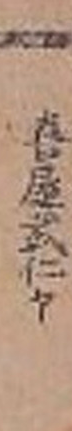喜屋武仁ヤ
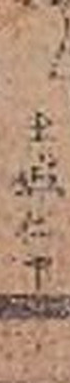玉城仁ヤ
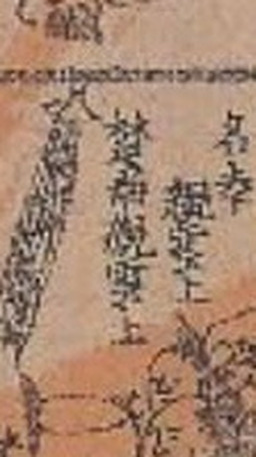楚南親雲上
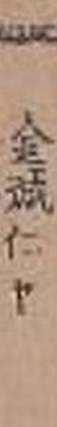金城仁ヤ
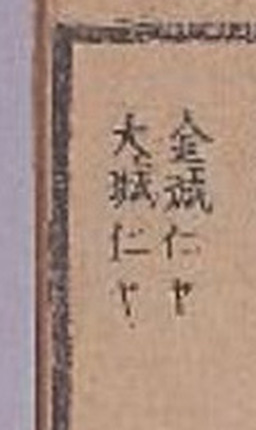大城仁ヤ

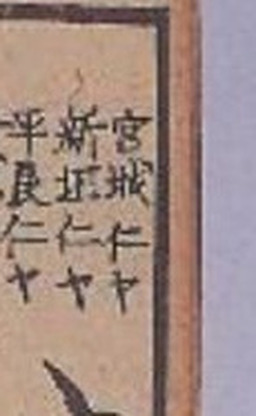宮城仁ヤ
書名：琉球人行列附 嘉永三庚戌年十一月
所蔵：University of the Ryukyus Library
